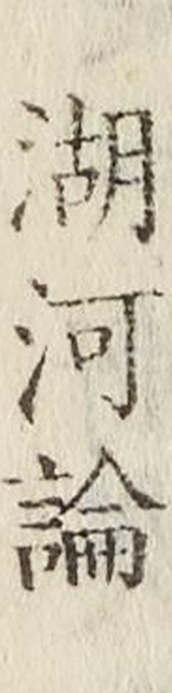湖河論
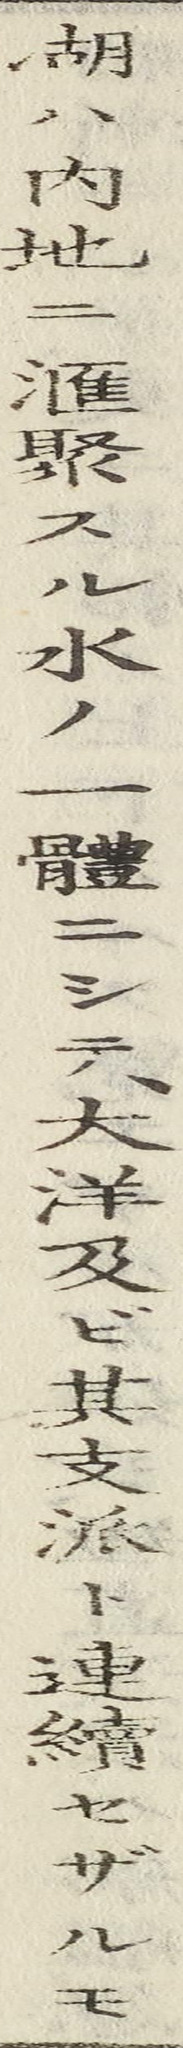湖ハ内地ニ匯聚スル水ノ一体ニシテ、大洋及ビ其支派ト連続セザルモ
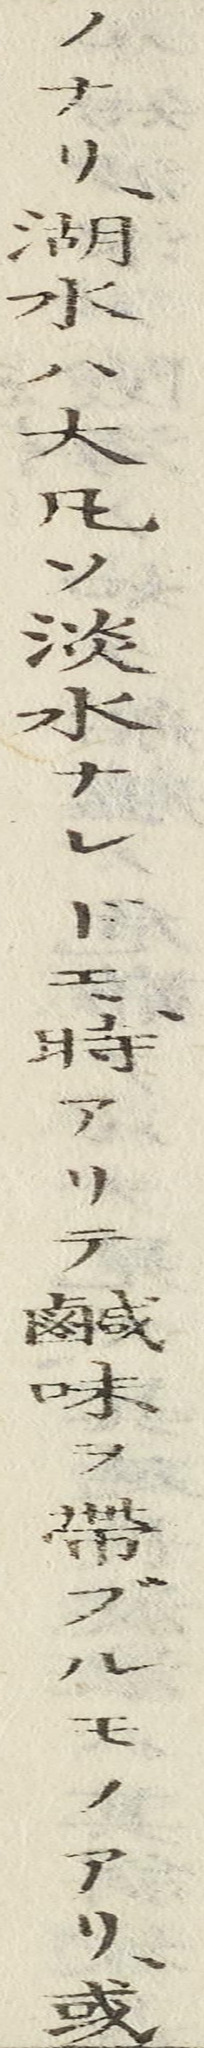ノナリ、湖水ハ大凡ソ淡水ナレドモ、時アリテ鹹味ヲ帯ブルモノアリ、或
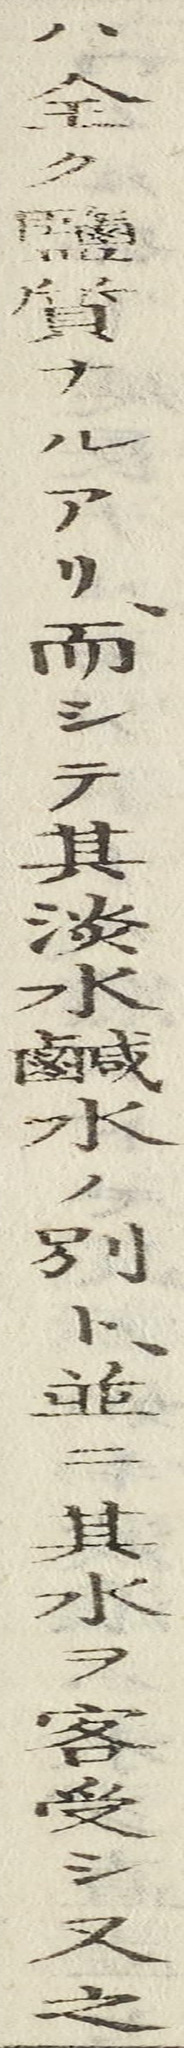ハ全ク塩質ナルアリ、而シテ其淡水鹹水ノ別ト、並ニ其水ヲ客受シ又之
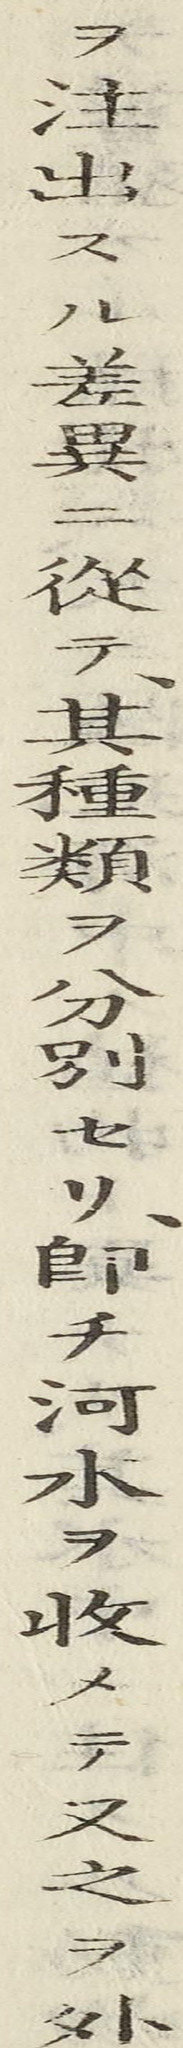ヲ注出スル差異ニ従テ、其種類ヲ分別セリ、即チ河水ヲ収メテ又之ヲ外
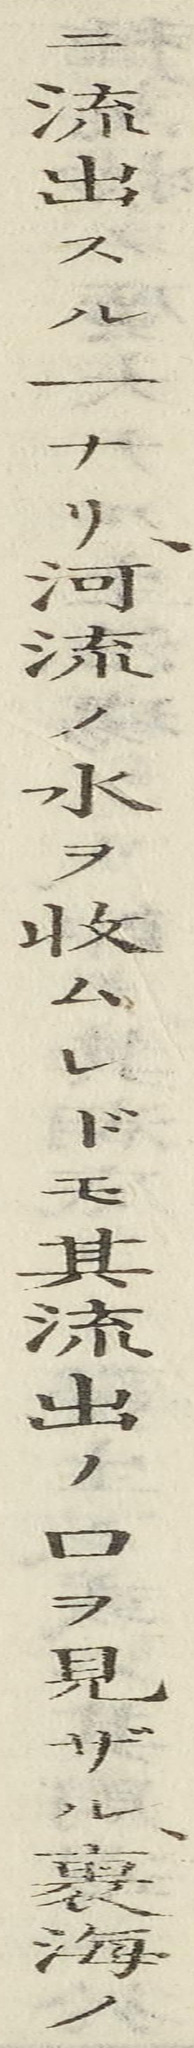ニ流出スル一ナリ、河流ノ水ヲ収ムレドモ其流出ノ口ヲ見ザル、裏海ノ
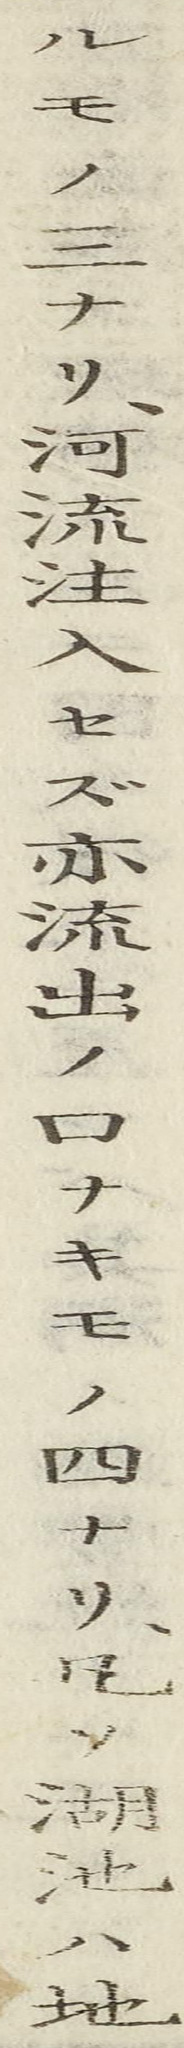ルモノ三ナリ、河流注入セズ亦流出ノ口ナキモノ四ナリ、凡ソ湖池ハ地
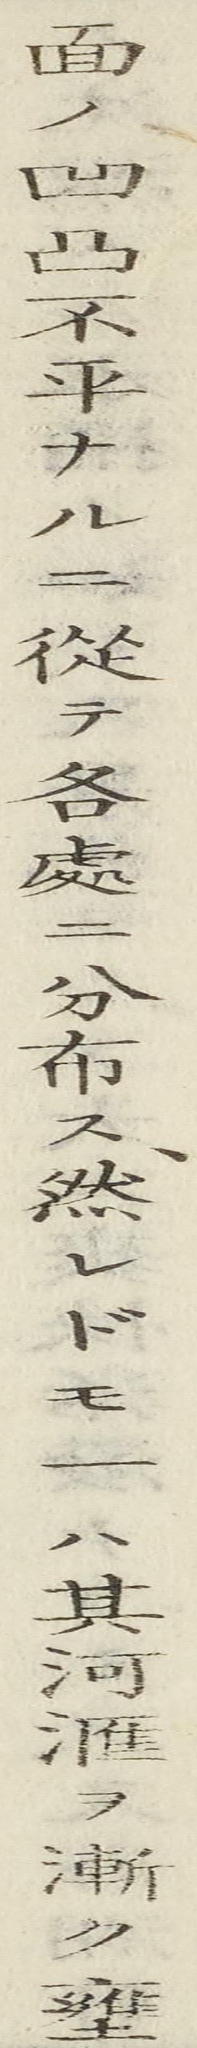面ノ凹凸不平ナルニ従テ各処ニ分布ス、然レドモ一ハ其河匯ヲ漸ク壅
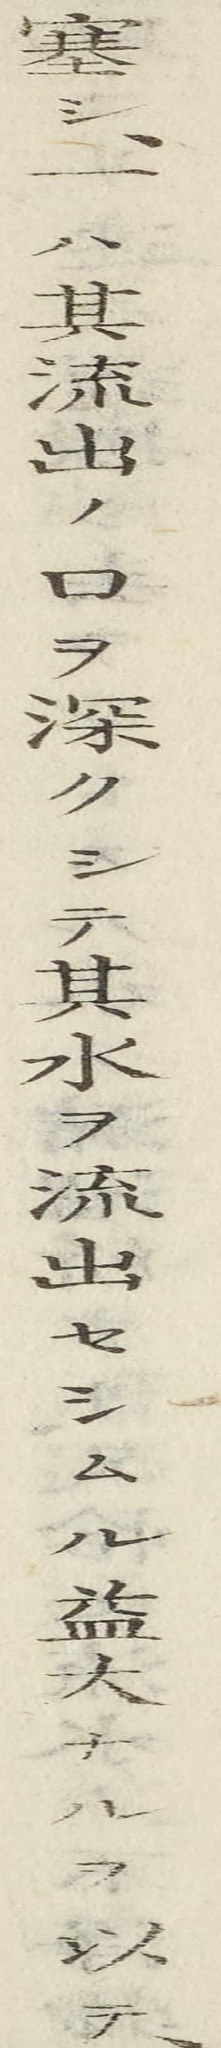塞シ、一ハ其流出ノ口ヲ深クシテ其水ヲ流出セシムル益大ナルヲ以テ、
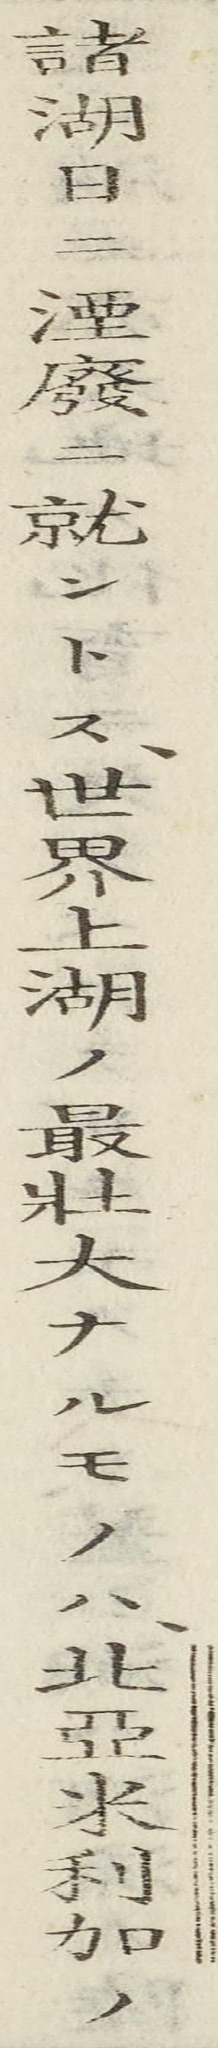諸湖日ニ湮廃ニ就ントス、世界上湖ノ最壮大ナルモノハ、北亜米利加ノ
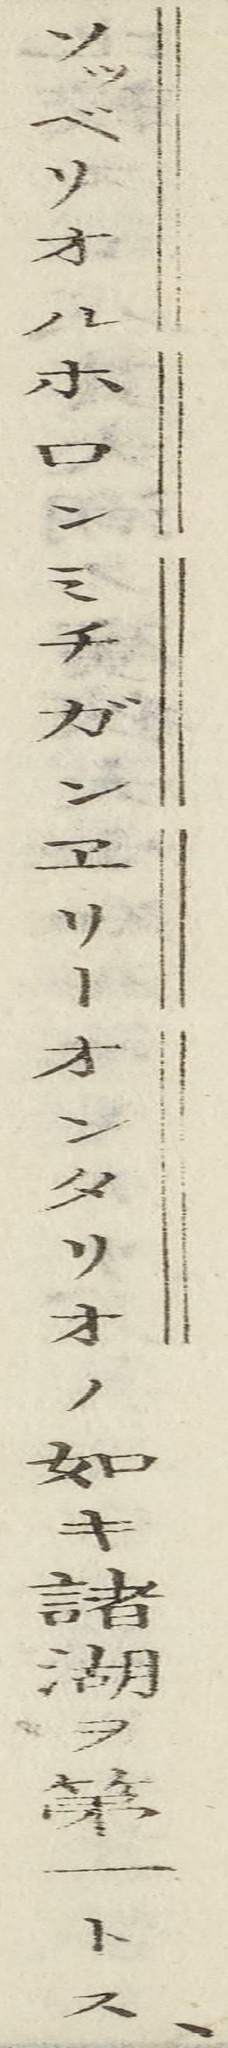ソッペリオルホロンミチガンエリーオンタリオノ如キ諸湖ヲ第一トス、
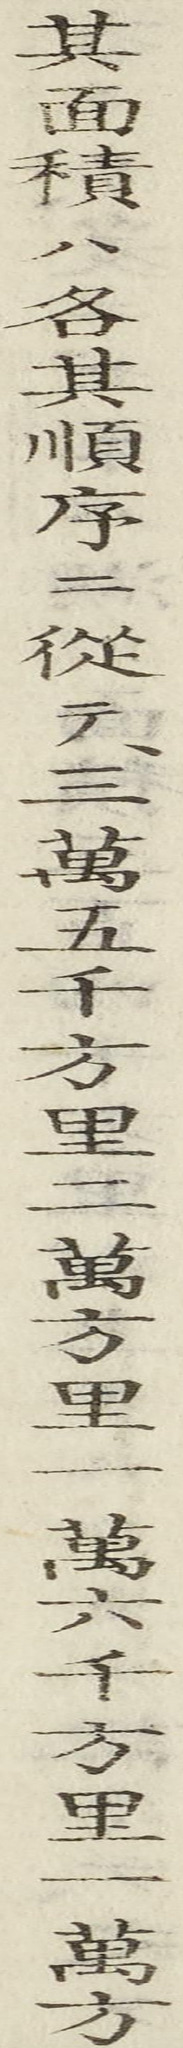其面積ハ各其順序ニ従テ、三万五千方里二万方里一万六千方里一万方
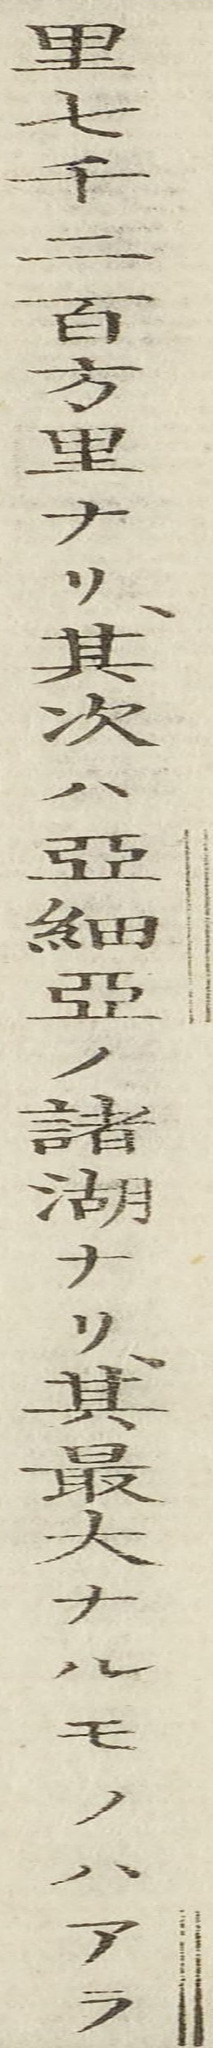里七千二百方里ナリ、其次ハ亜細亜ノ諸湖ナリ、其最大ナルモノハアラ
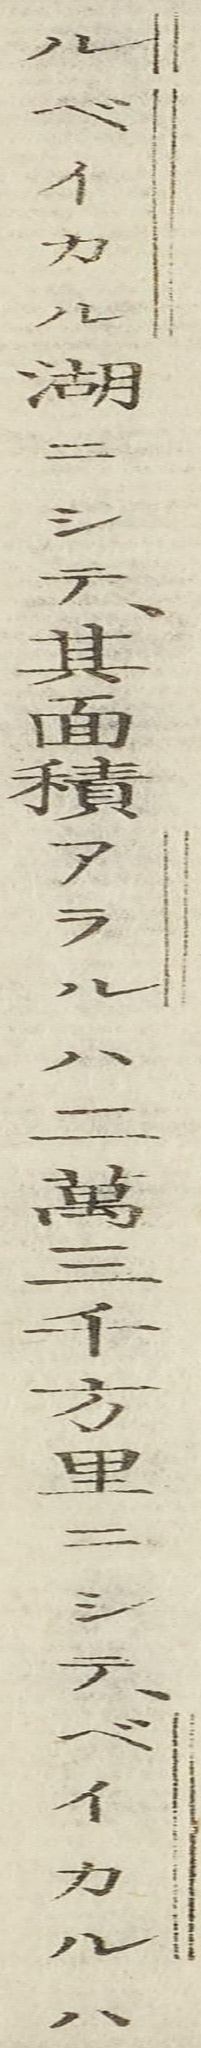ルベイカル湖ニシテ、其面積アラルハ二万三千方里ニシテ、ベイカルハ
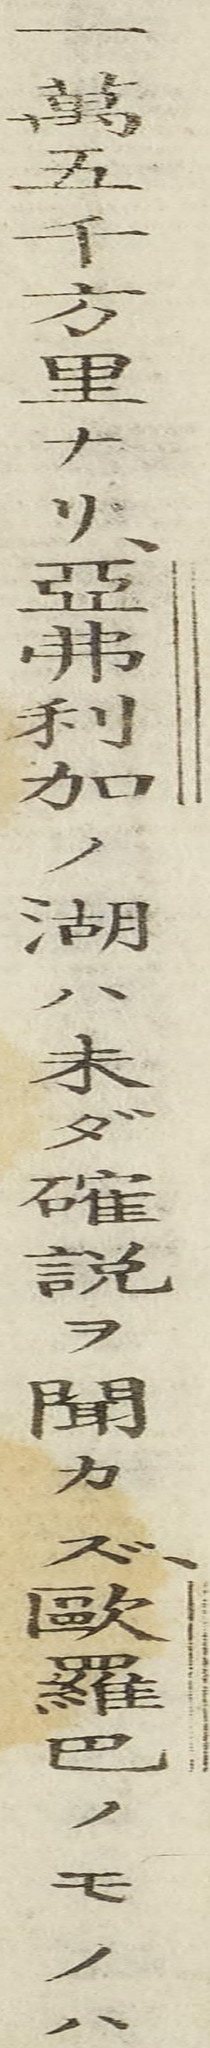一万五千方里ナリ、阿弗利加ノ湖ハ未ダ確説ヲ聞カズ、欧羅巴ノモノハ

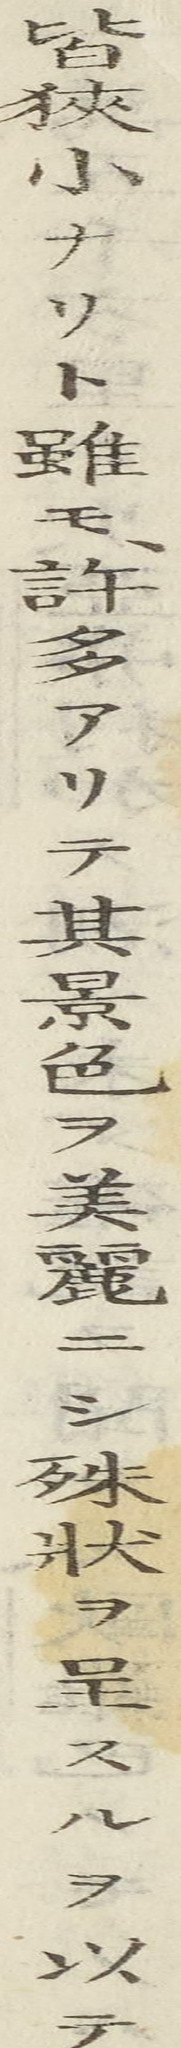皆狭小ナリト雖モ、許多アリテ其景色ヲ美麗ニシ殊状ヲ呈スルヲ以テ
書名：百科全書　地文學　全
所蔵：東京大学地震研究所図書室 Earthquake Research Institute Library, The University of Tokyo, JAPAN
